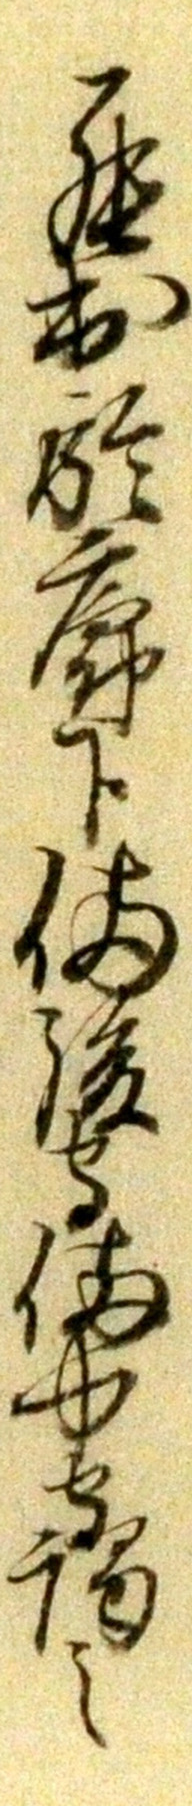罷出於廊下備後守備中守謁之
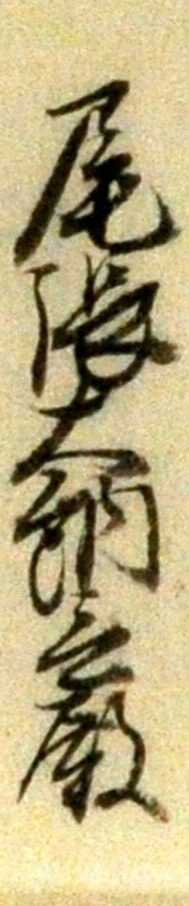同尾張大納言殿
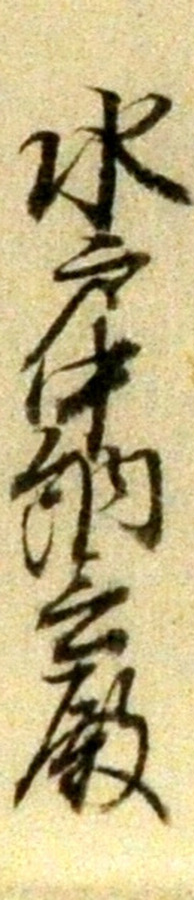同水戸中納言殿
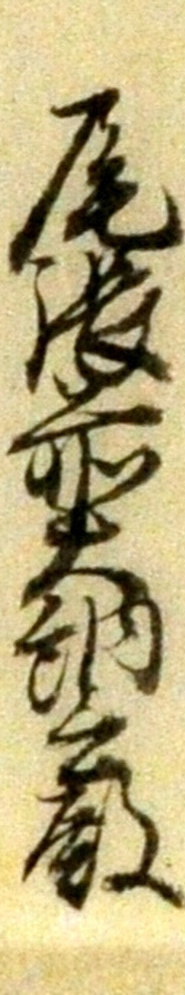同尾張前大納言殿
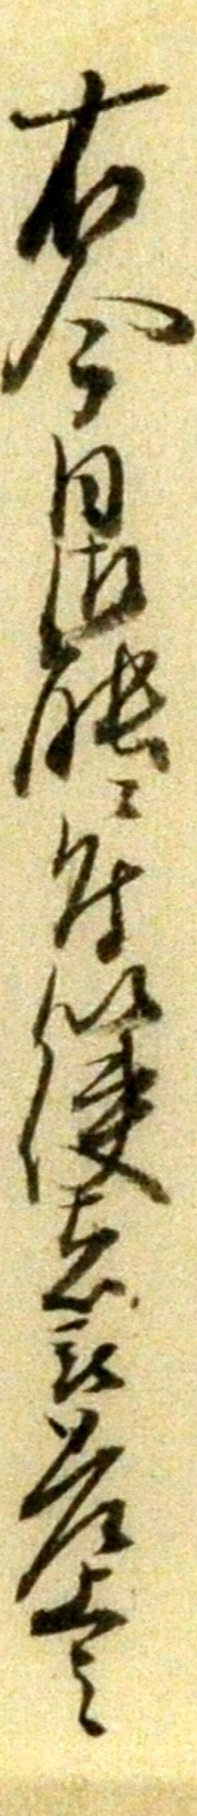右今日御能ニ付以使者被差上之
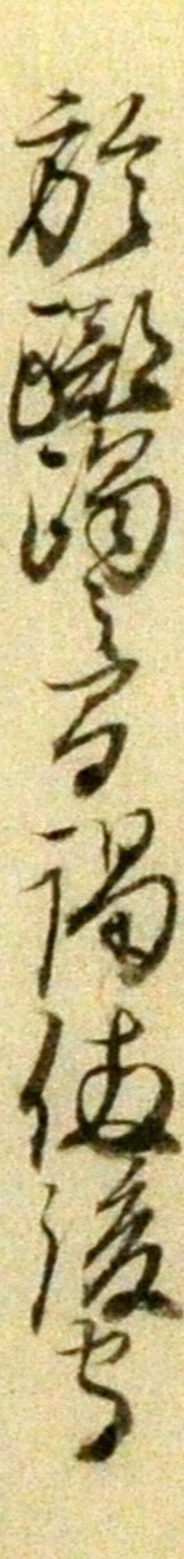於躑躅之間謁備後守
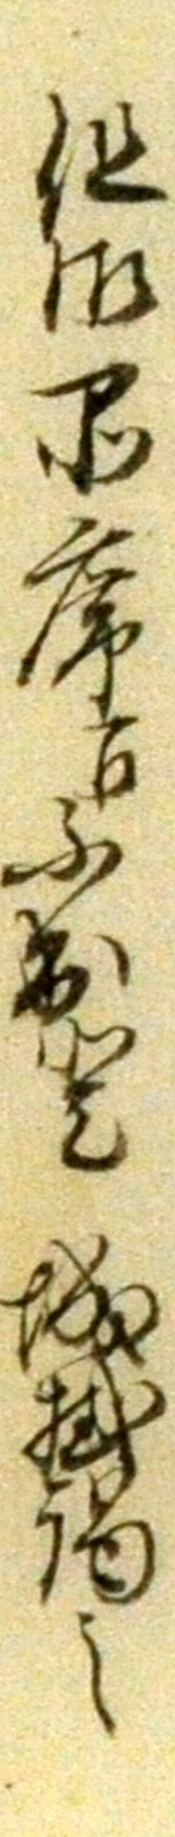但御品席え不出登城掛謁之

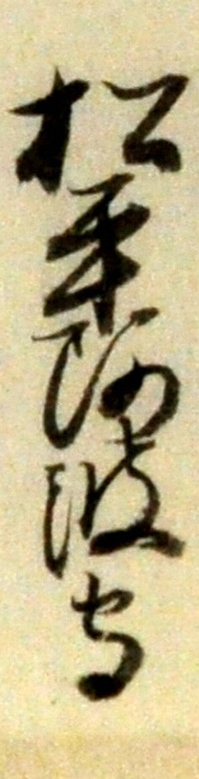同松平阿波守
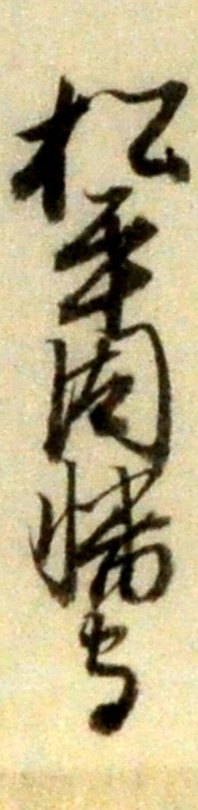同松平因幡守
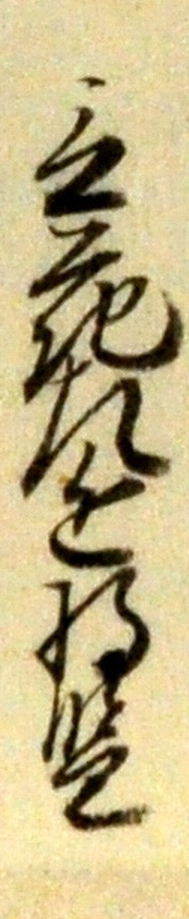同立花左近将監
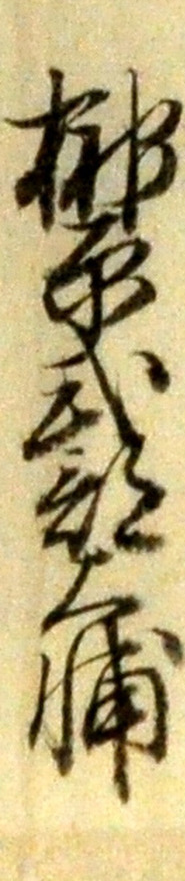同榊原式部大輔
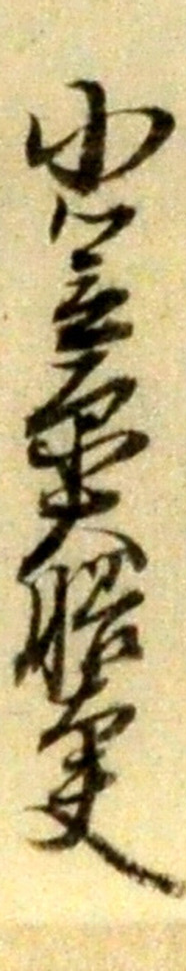同小笠原大膳大夫
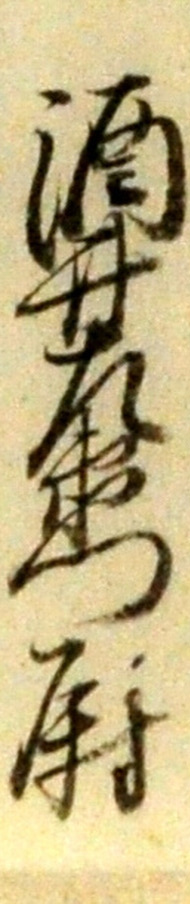同酒井左衛門尉

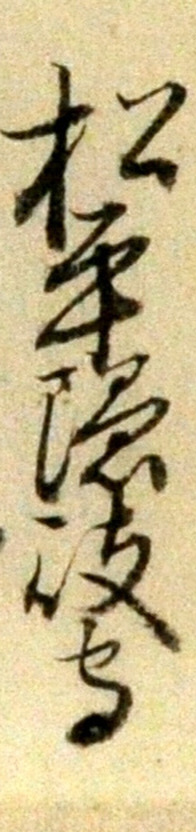松平隠岐守
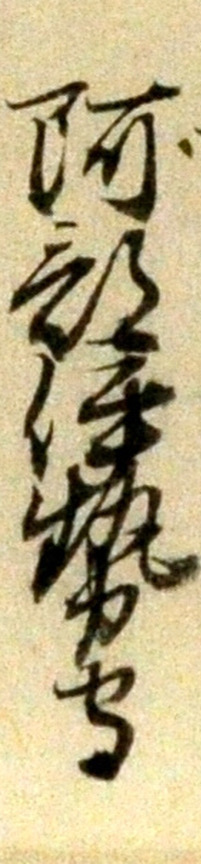阿部伊勢守
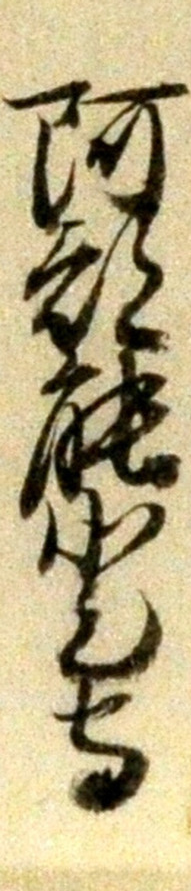阿部能登守
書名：御馳走御能ノ節ノ留外
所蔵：伊那市立高遠町図書館・合同会社AMANE
